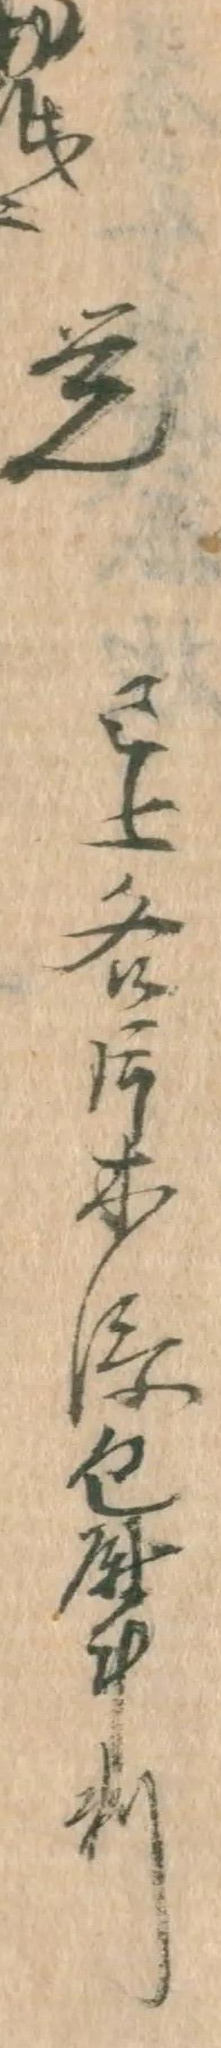已上各片木添包尉斗判
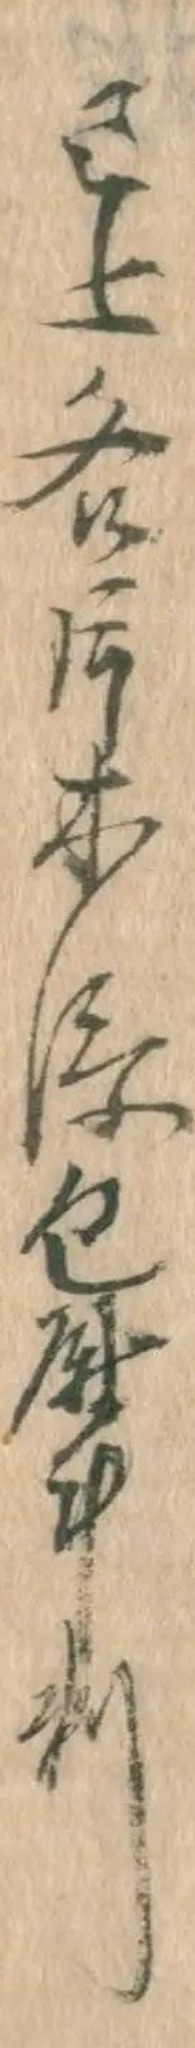已上各片木添包尉斗判
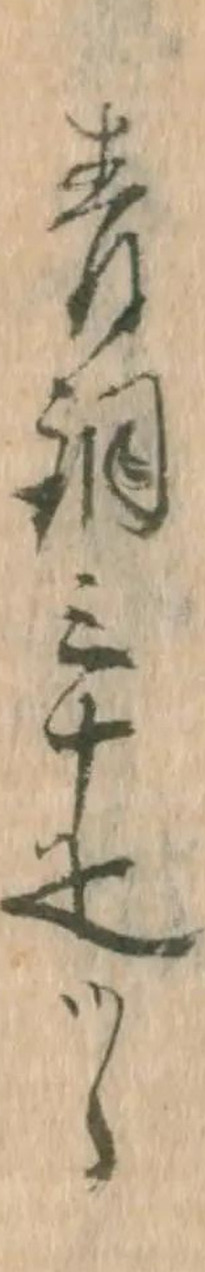青銅三十疋ツヽ
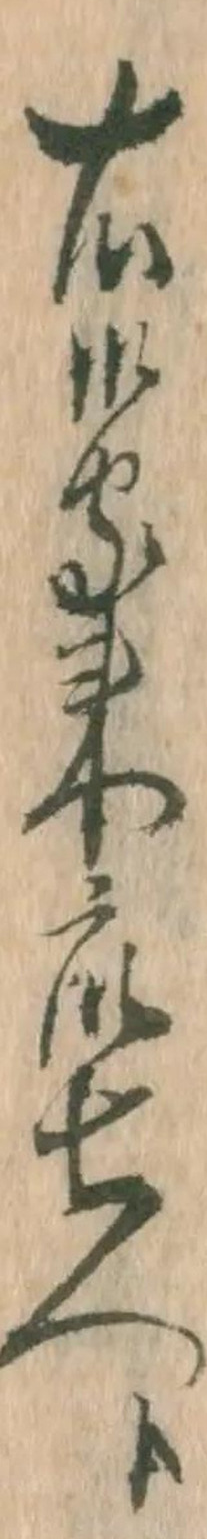右御家来衆七人え
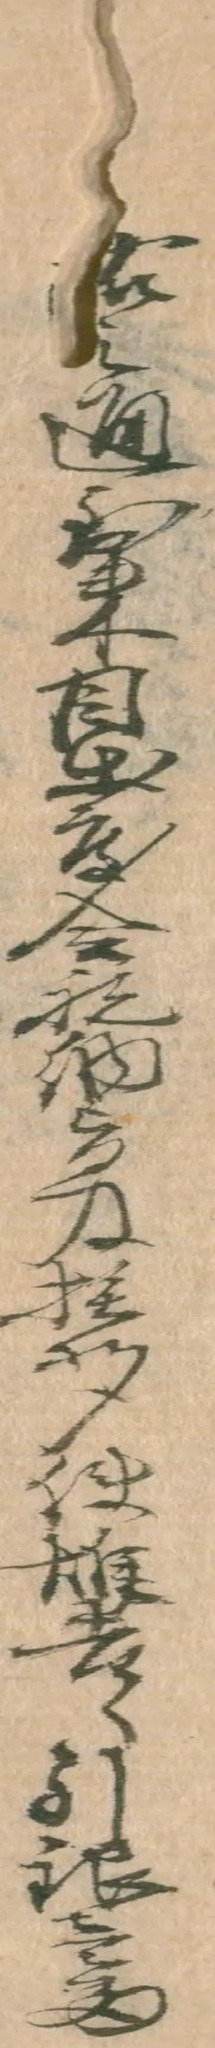右之通到来目出度令祝納旨及挨拶使雄吉へ引銀壱両
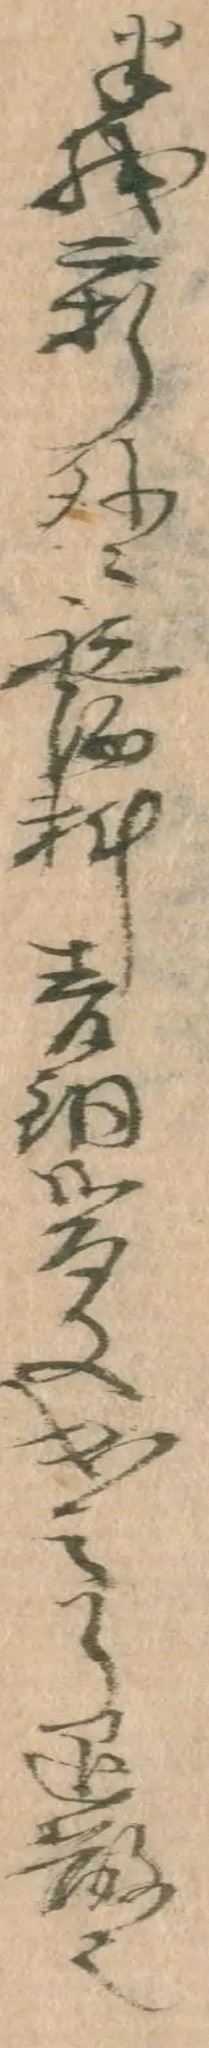半紙二折外二祝酒料青銅弐百文出之了退散也
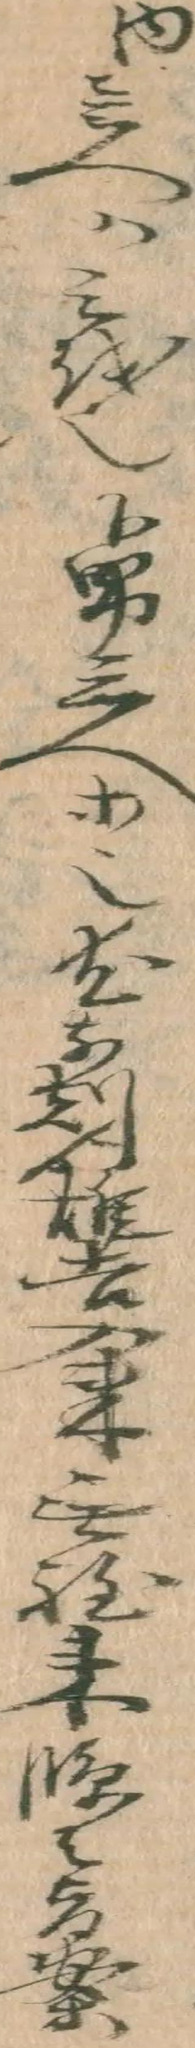内壱人ハ之儀也下男三人等也尤前刻雄吉入来無程来条之旨案
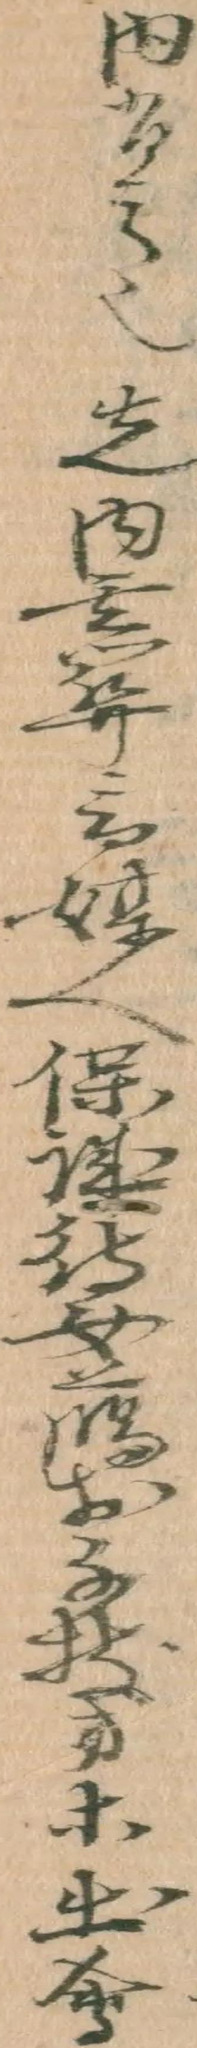内有之也先内玄関に而媒人保誠待女臈於ちえ方等出會
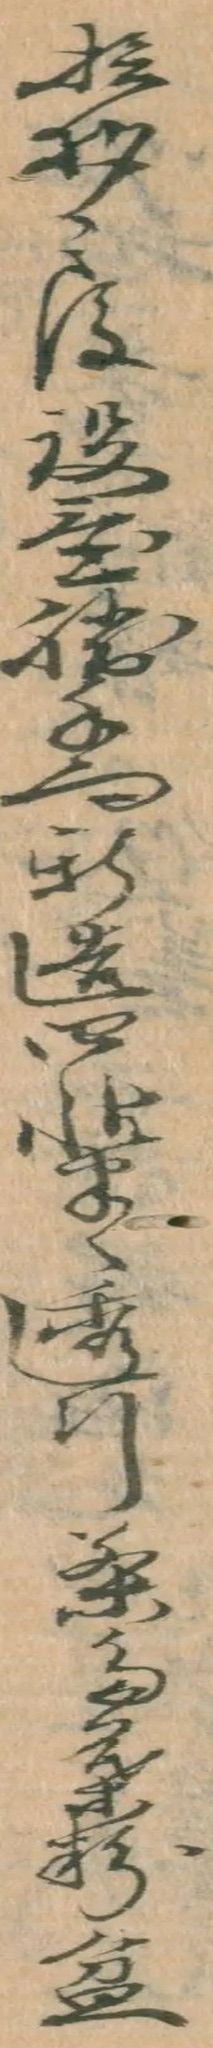挨拶之後設置勝手向新造四帖半へ透引茶た葉粉盆
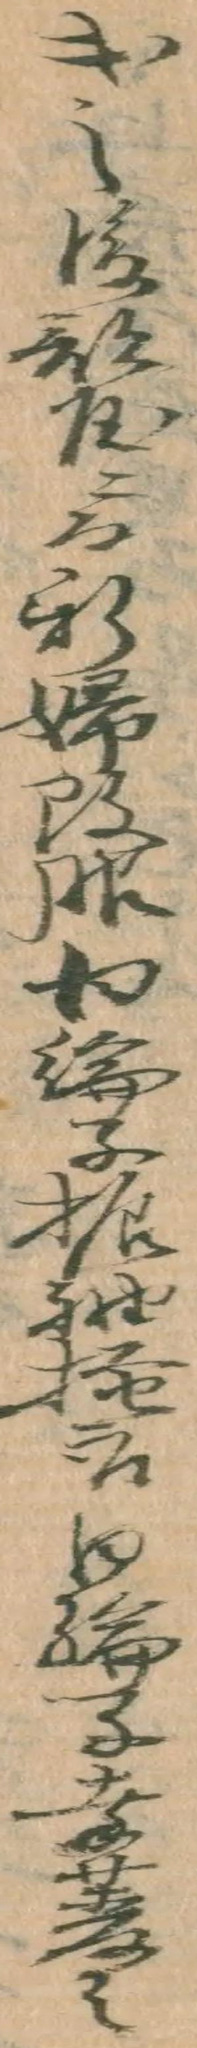出之後部屋ニ而新帰改服白綸子振袖掻取白綸子桑菱之
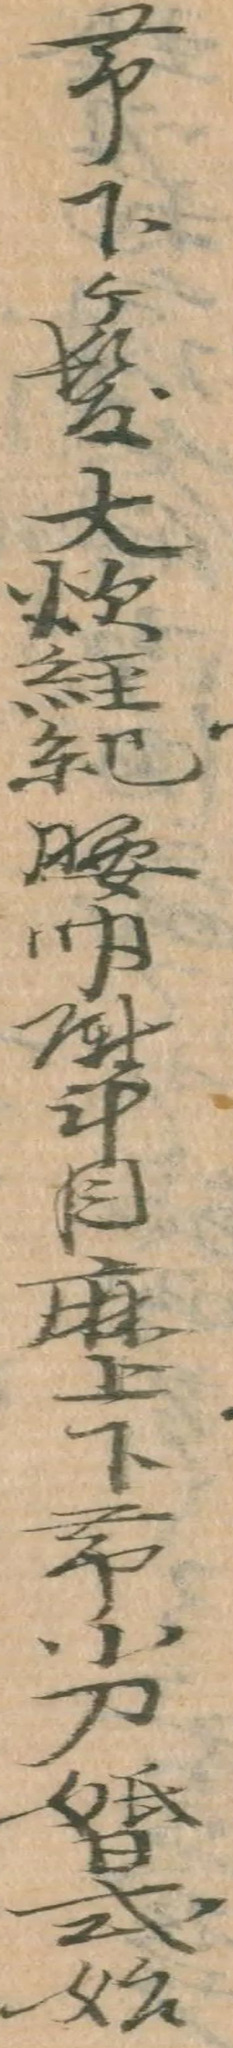帯下ケ髪大炊経紀腰明尉斗目麻上下小刀婚式始
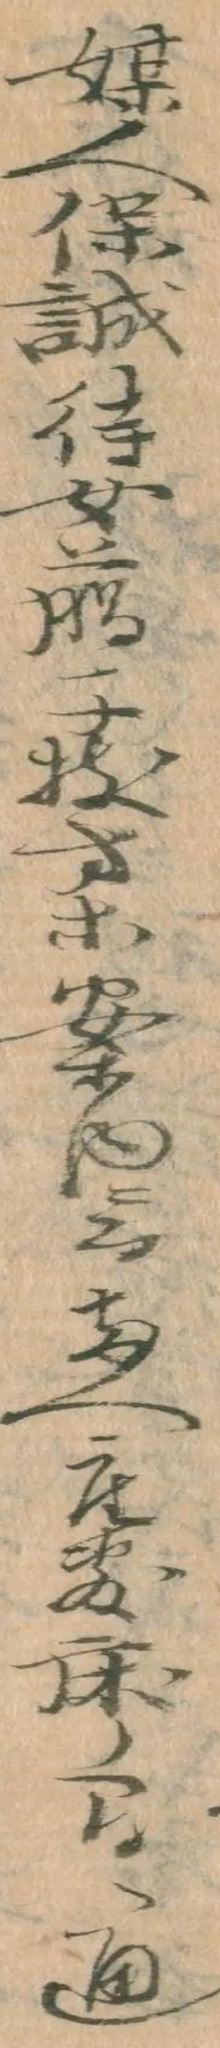媒人保誠待女臈ちえ方等案内ニ而両人座敷床ノ間へ通
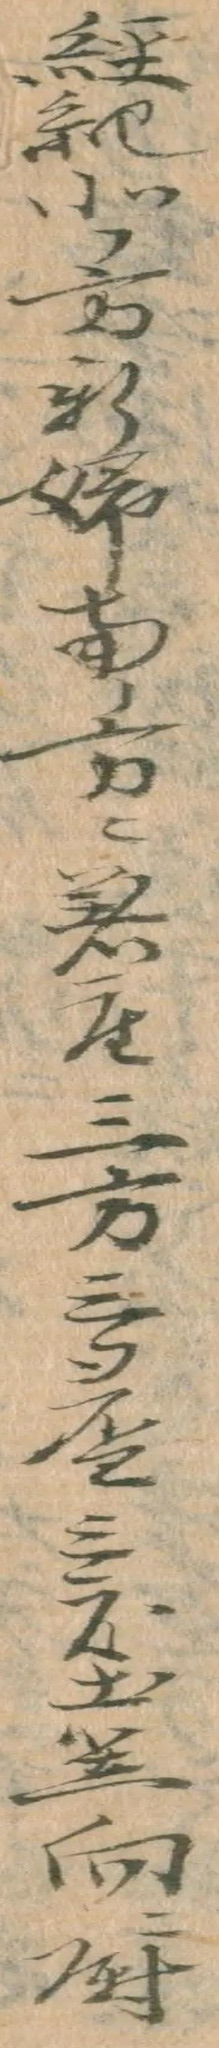経紀北ノ方新帰南ノ方ニ着座三方三ツ盃三度土器向ニ尉
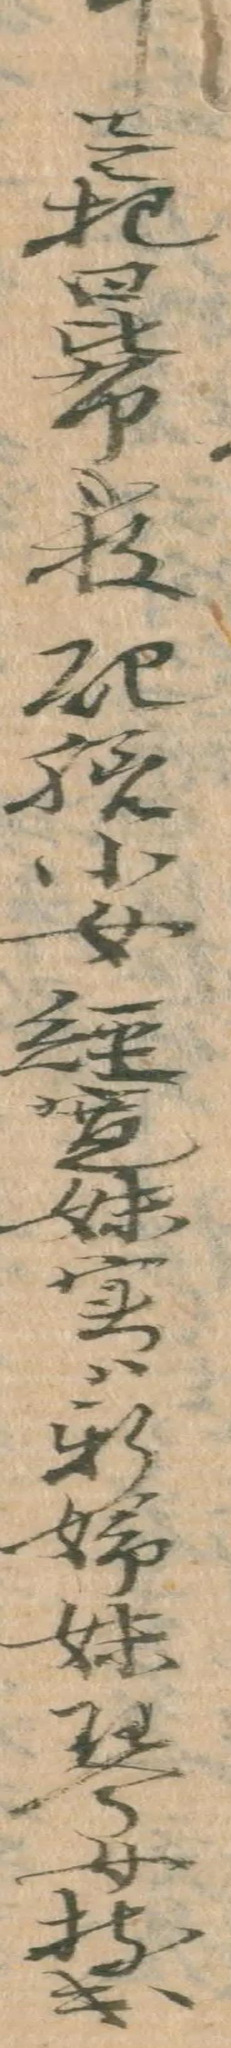斗壱把昆布弐枚配膳小女経寛妹実ハ新婦妹琴女持出
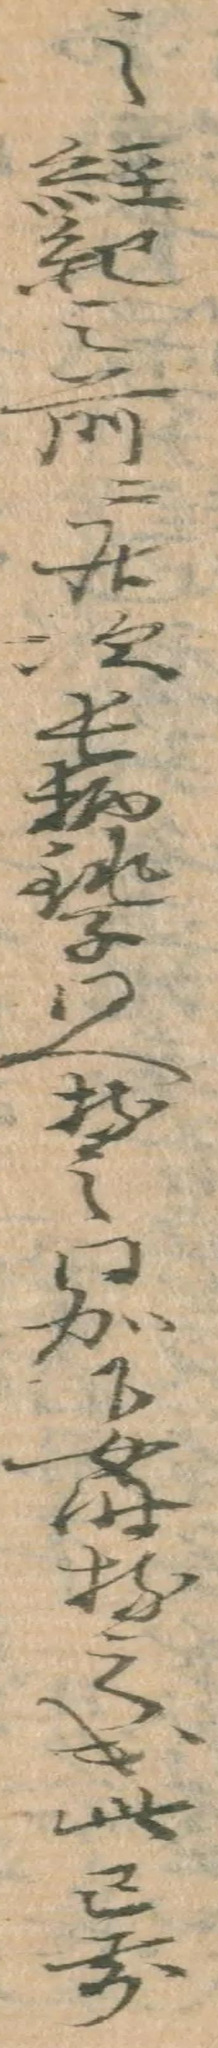也経紀之前ニ居次長柄銚子同人持之同加下女時持之出此已前
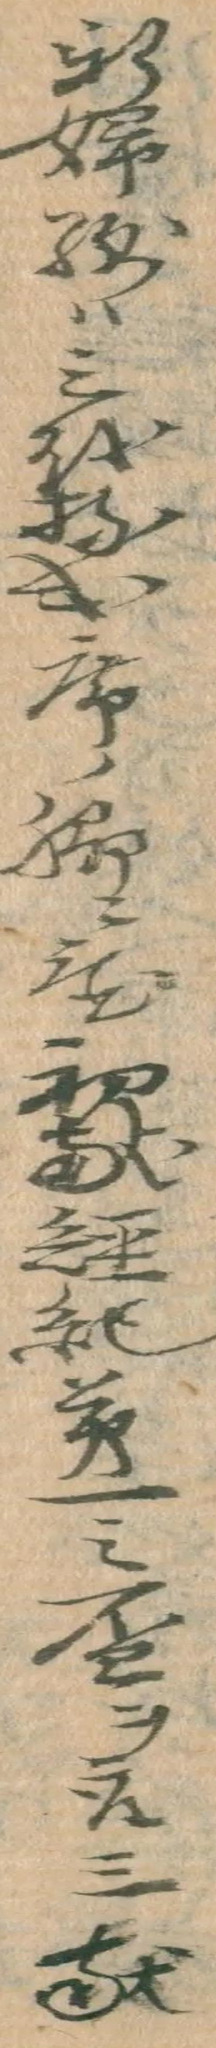新婦孫ハ三越持出席ノ脚に置初献経紀第一之盃ヲ取三献
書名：賀茂社記録. 第69冊
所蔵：国立国会図書館 National Diet Library, JAPAN
